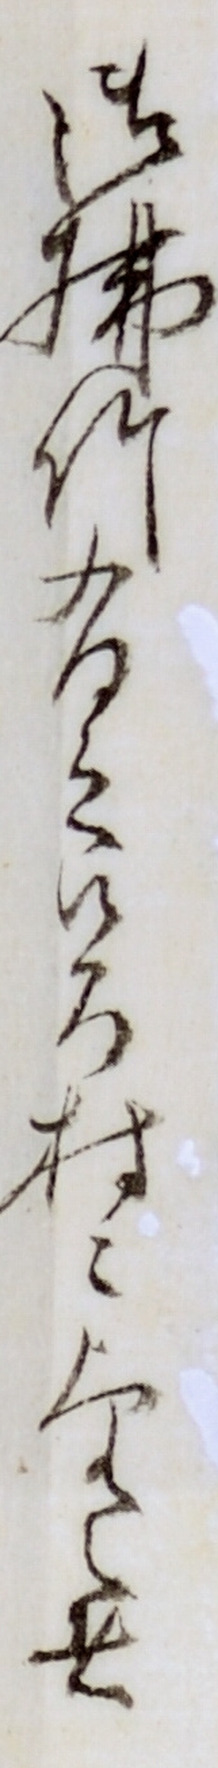御払竹有之候間村々望之者
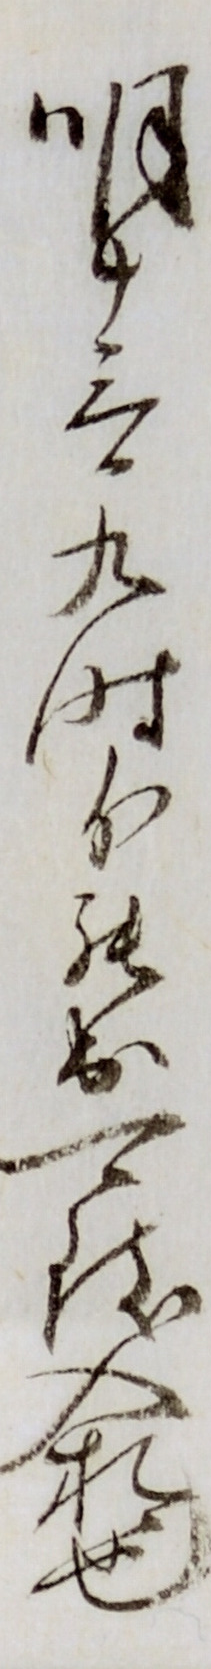明十三日九時ゟ罷出可致入札候也
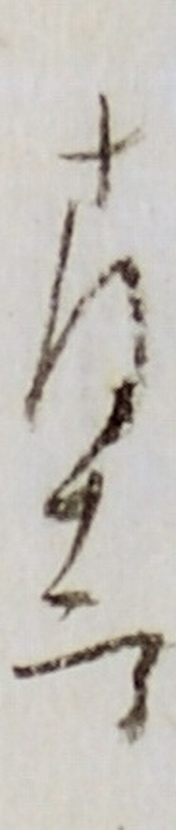十月十二日
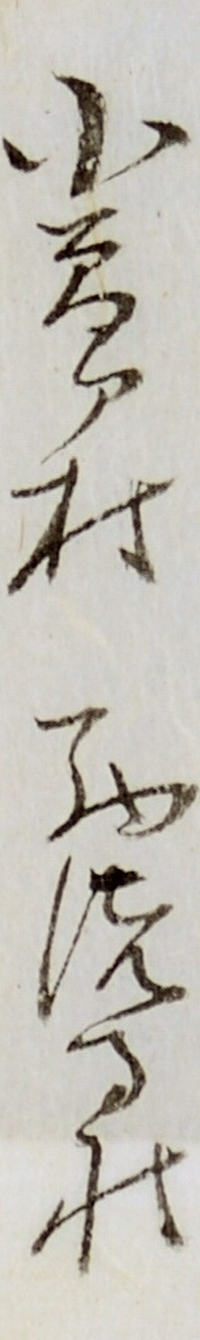小曽部村西洗馬村
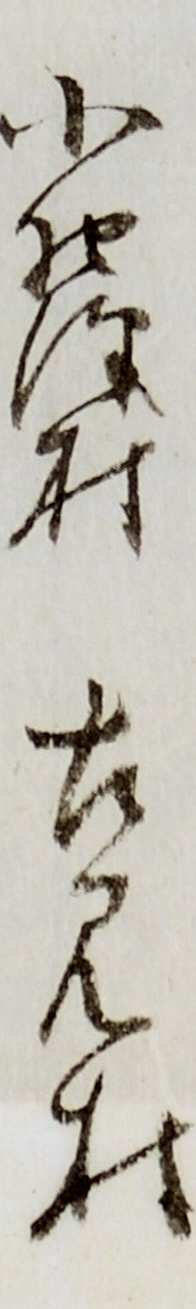小野沢村古見村
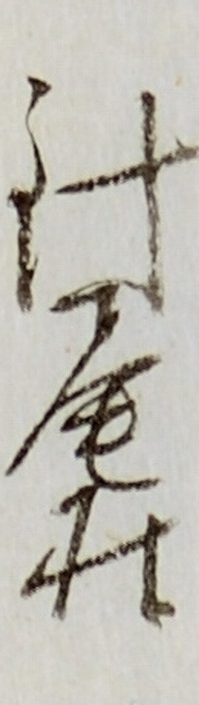針尾村
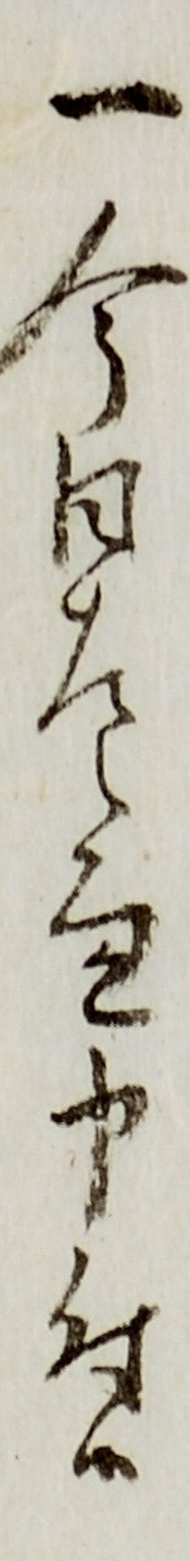一今日左之通申付候
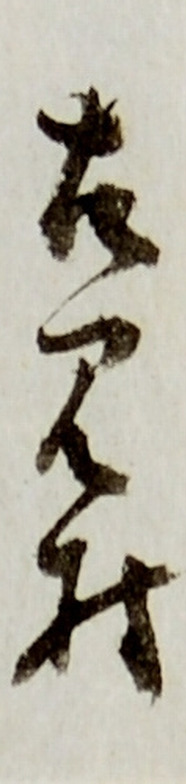古見村
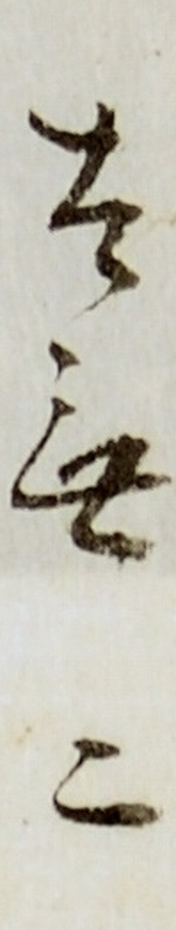太無二
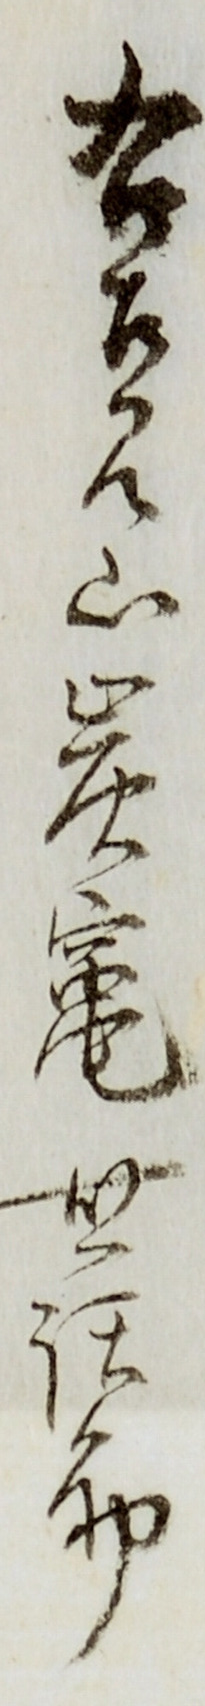右古見山炭竃世話筋
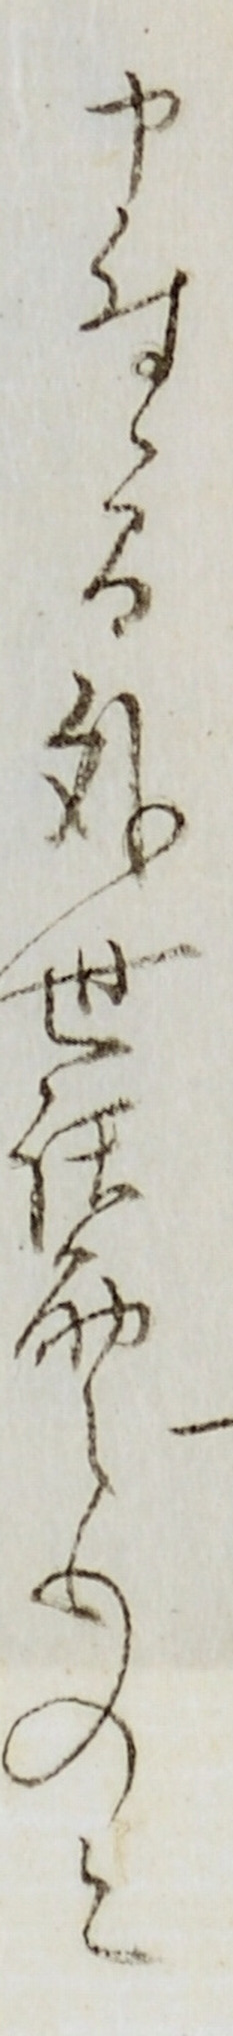申付候間外世話筋のものと
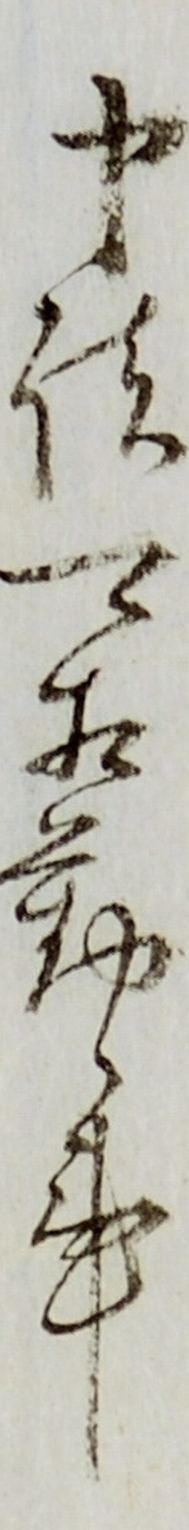申談可相勤候事
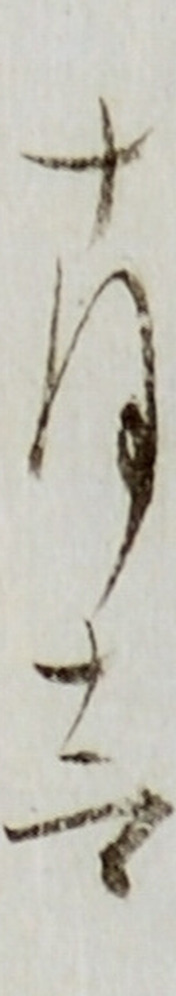十月十二日
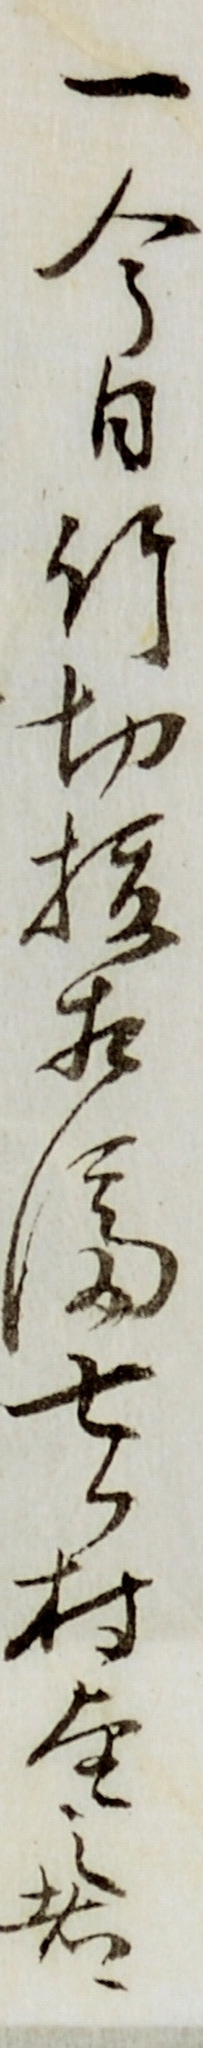一今日竹切抜相済七ヶ村望之者へ
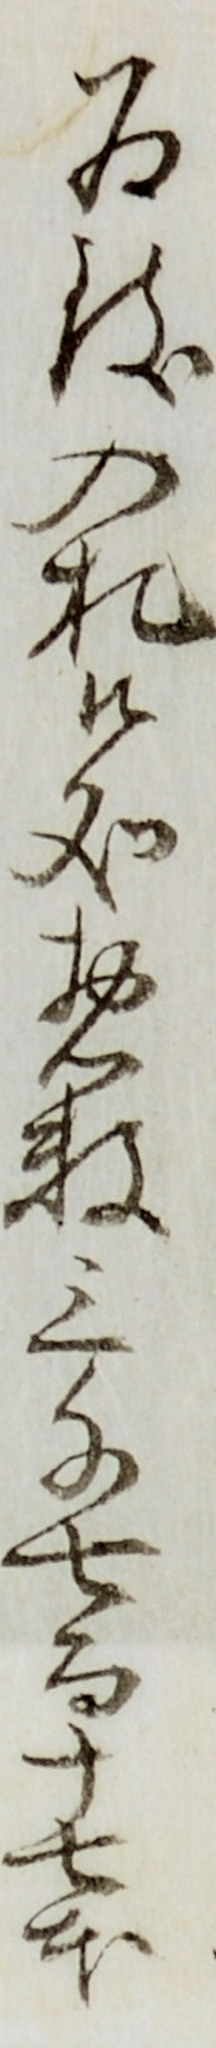為致入札候処惣数三千七百十七本
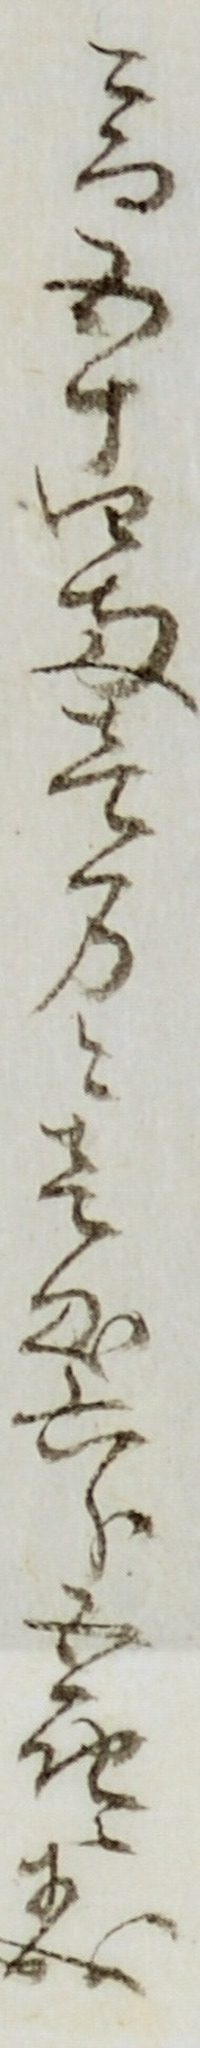にて五十四両壱分と壱匁六分五厘に相成
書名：山林方諸事御用留
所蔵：伊那市立高遠町図書館・合同会社AMANE
